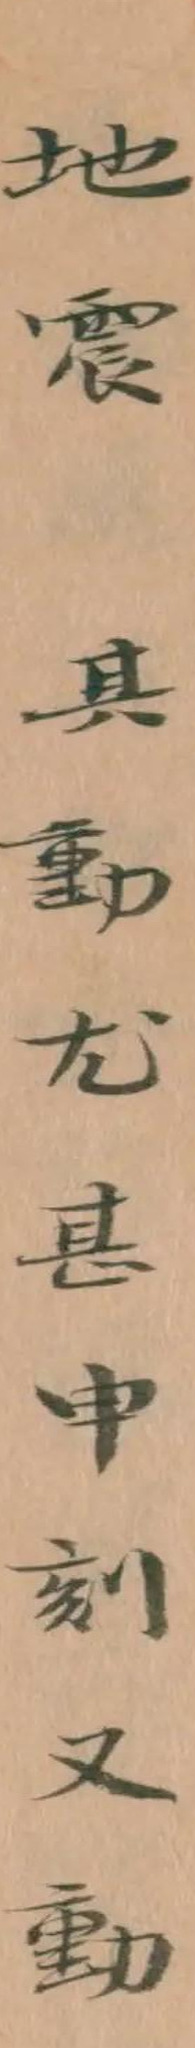地震其動尤甚申刻又動
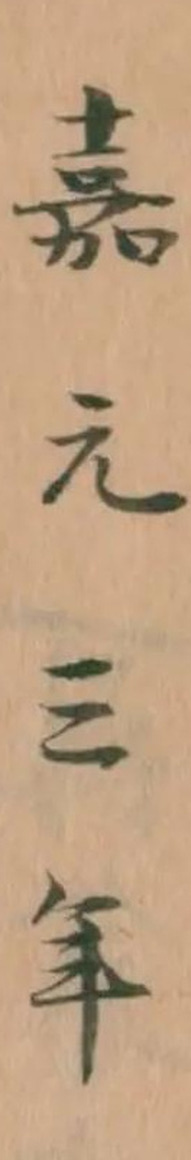嘉元三年
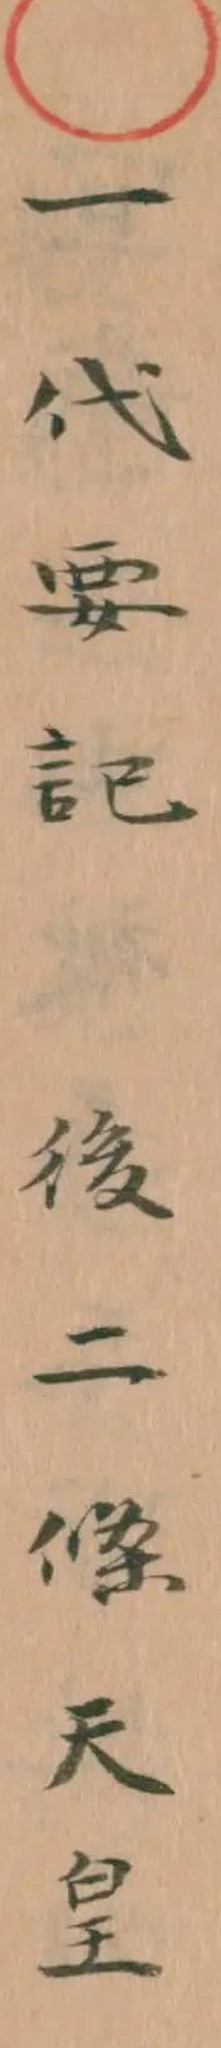○一代要記後二条天皇
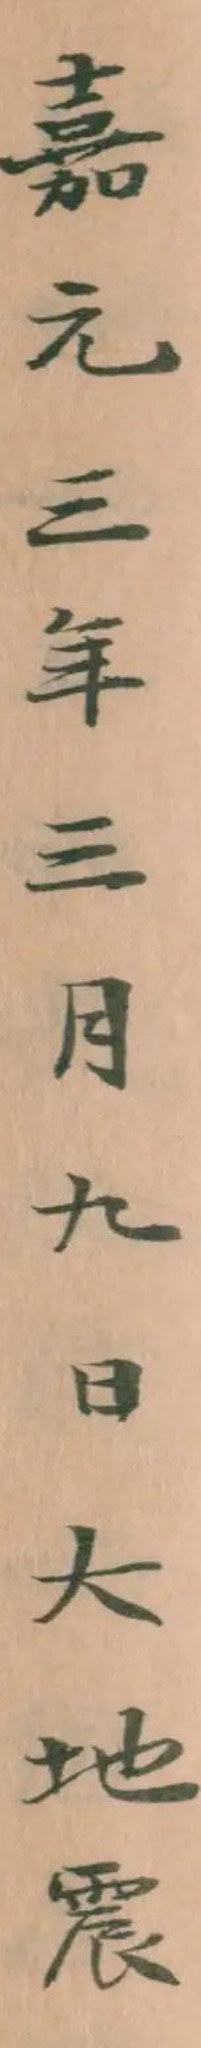嘉元三年三月九日大地震
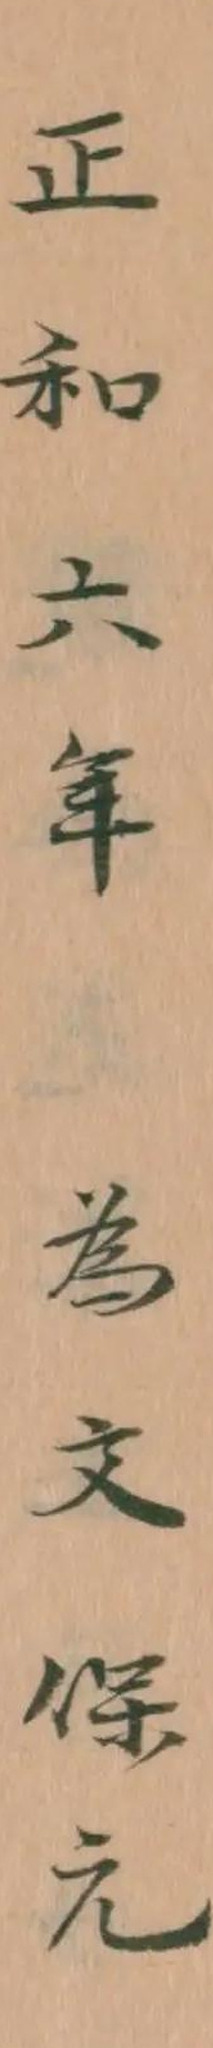正和六年為文保元
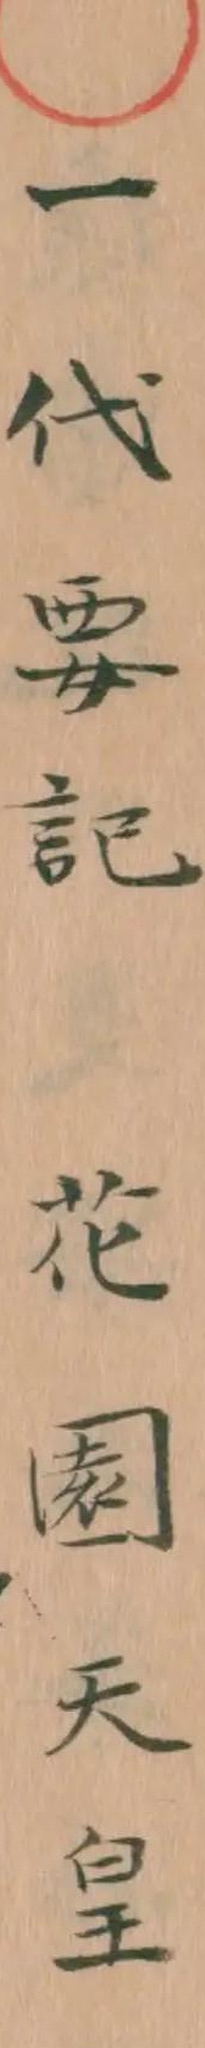○一代要記花園天皇
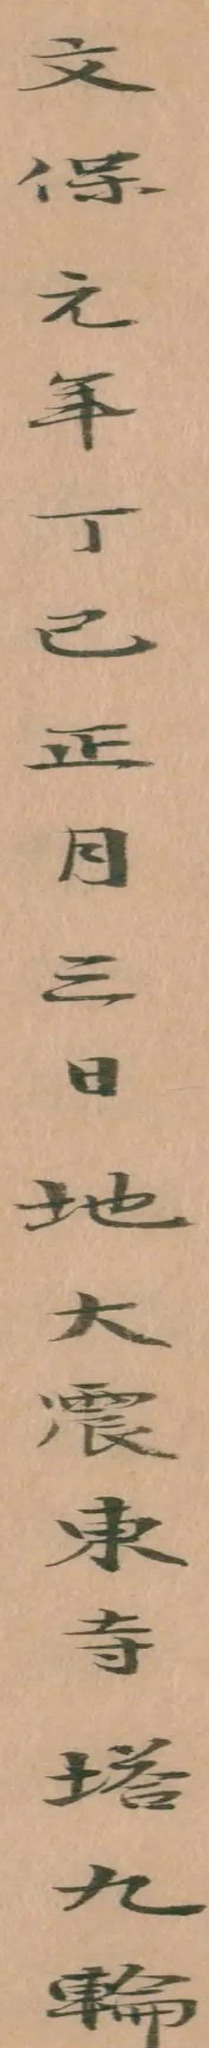文保元年丁巳正月三日地大震東寺塔九輪
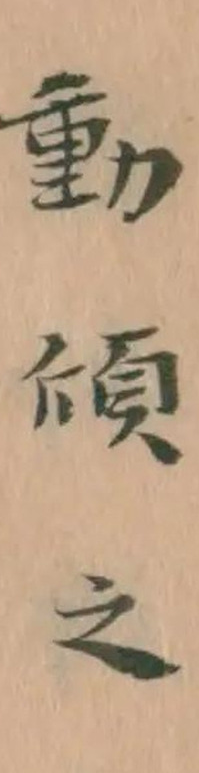動傾之
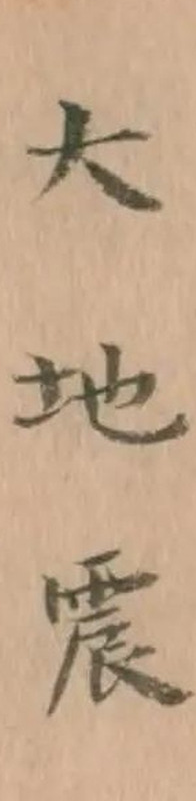大地震
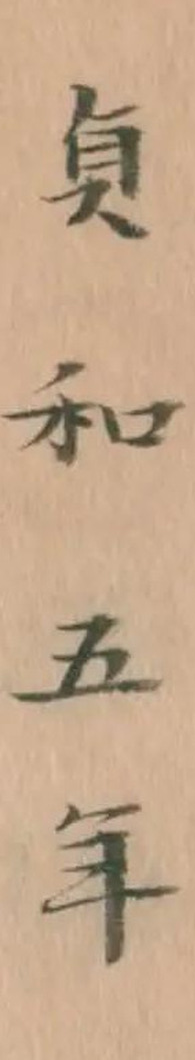貞和五年

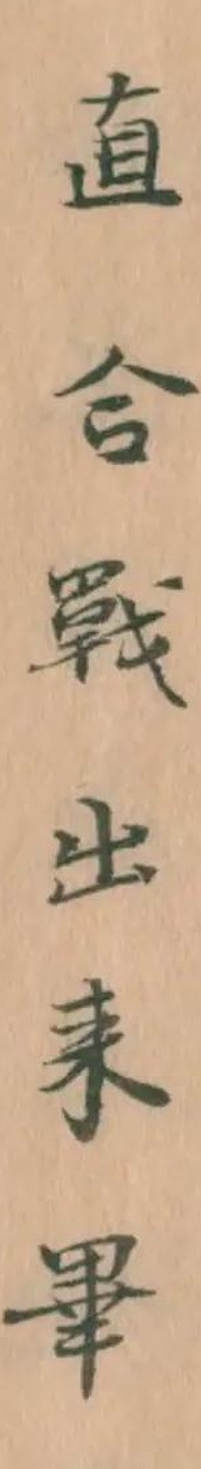直合戦出来畢
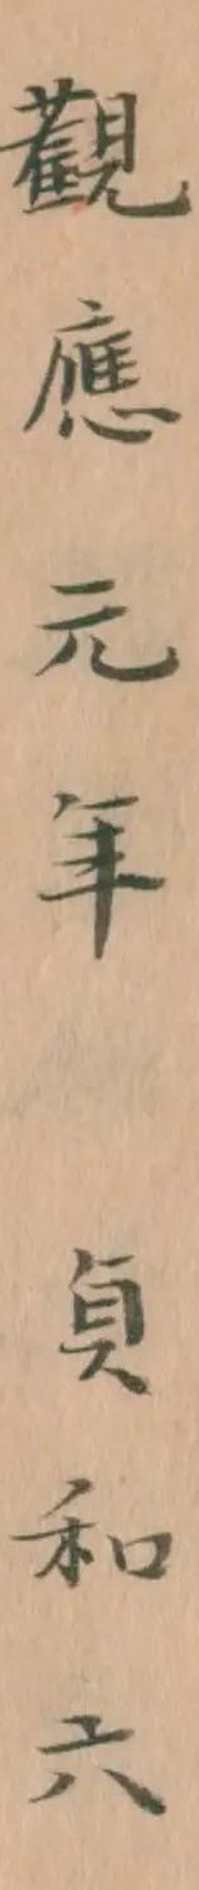観応元年貞和六
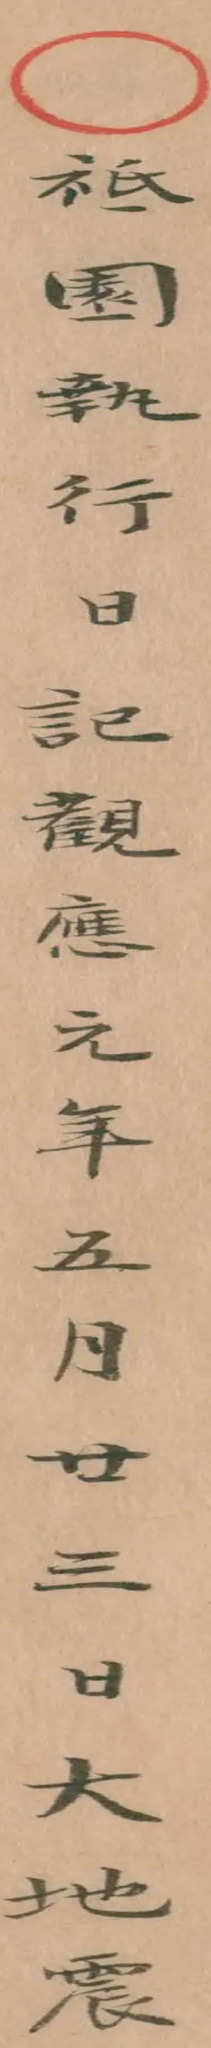○祗園執行日記観応元年五月廿三日大地震
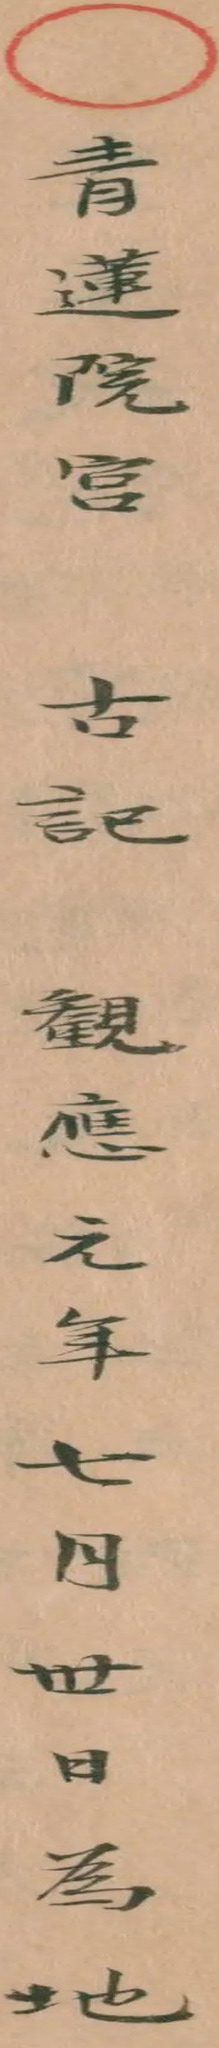○青蓮院宮古記観応元年七月卅日為地
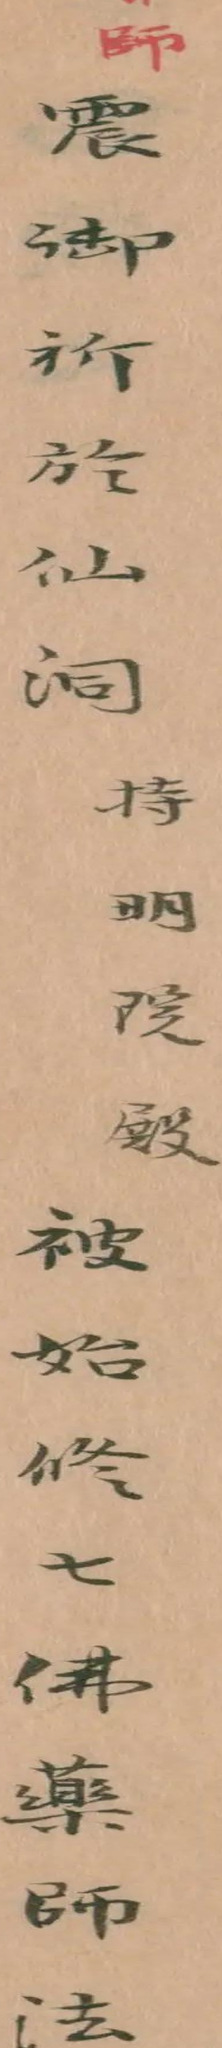震御祈於仙洞持明院殿被始修七仏薬師法
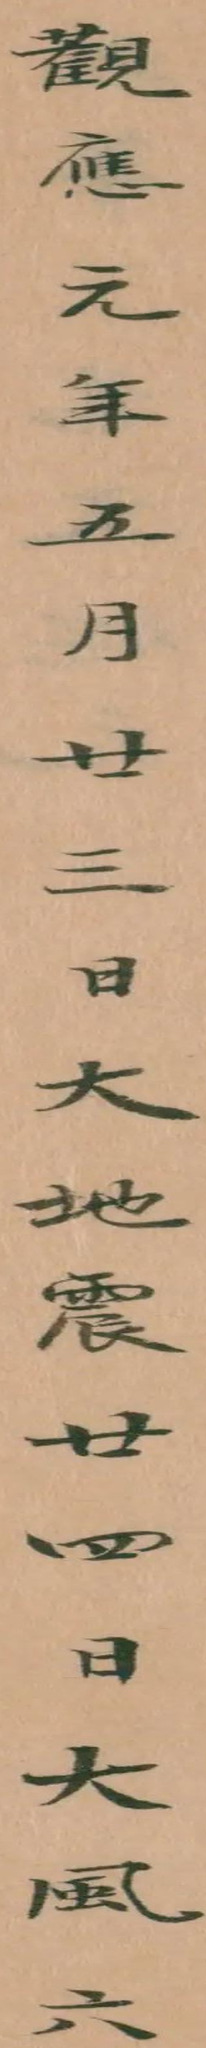観応元年五月廿三日大地震廿四日大風六
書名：地災撮要. 巻5-6(地震之部)
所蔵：国立国会図書館 National Diet Library, JAPAN
